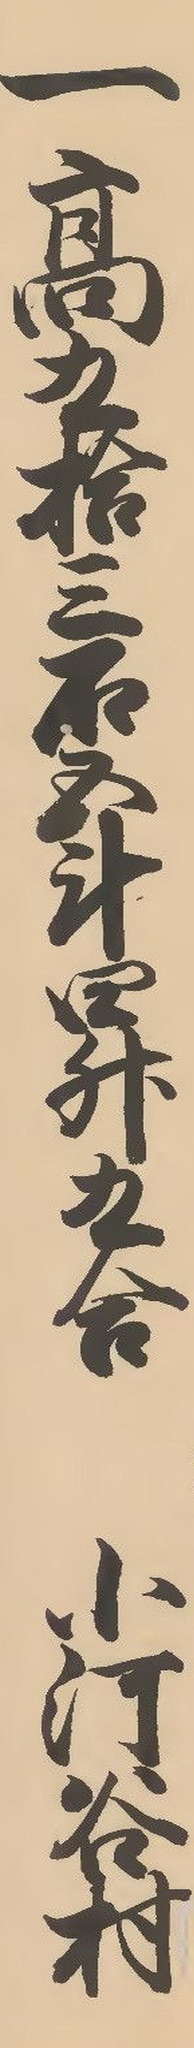一髙九拾三石五斗四升九合小河谷村
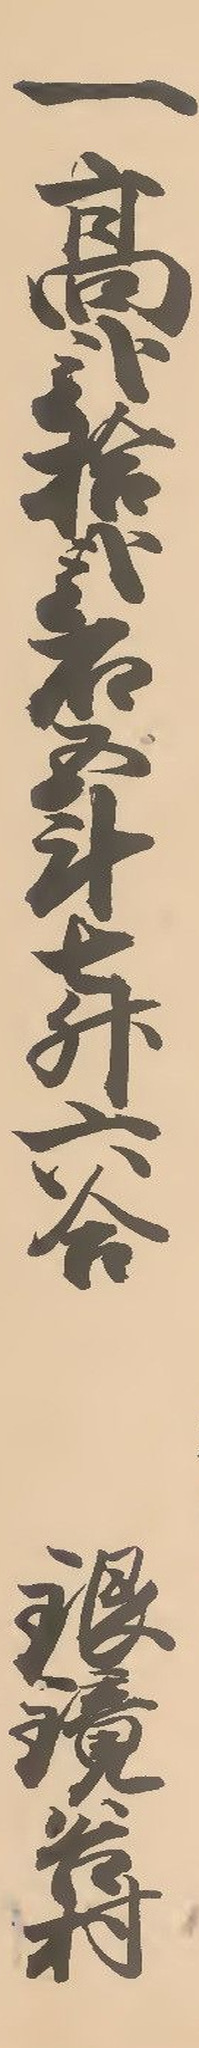一髙弐拾弐石五斗七升六合銀鏡谷村
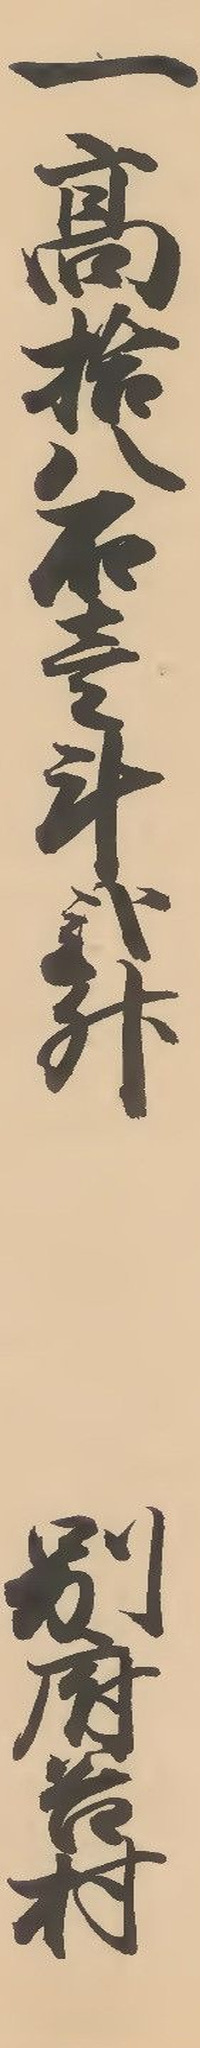一髙拾八石壱斗弐升別府谷村
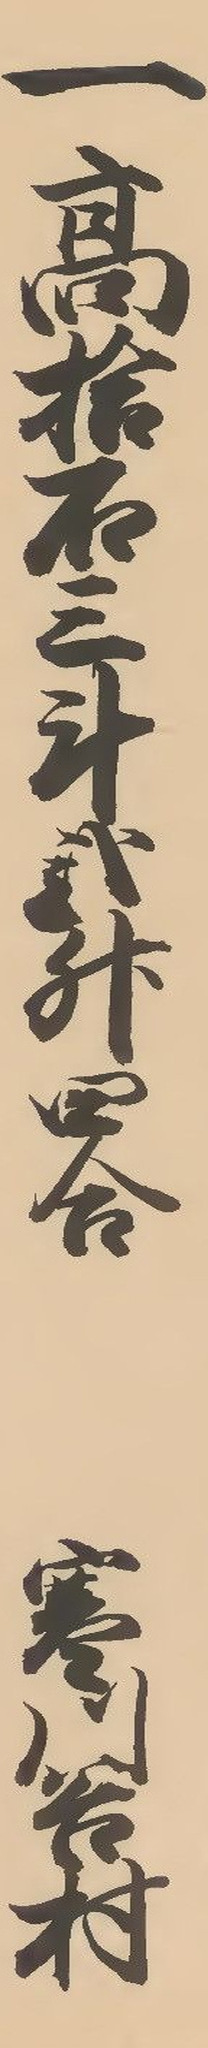一髙拾石三斗弐升四合寒川谷村
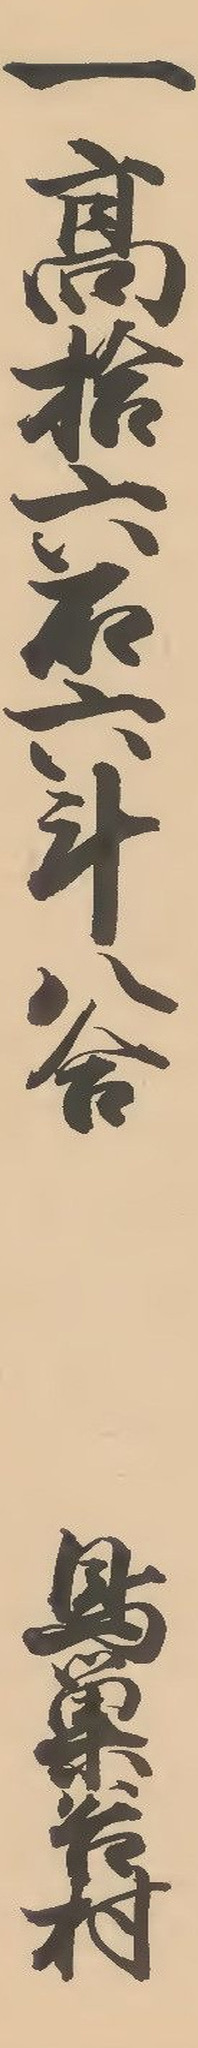一髙拾六石六斗八合鳥巣谷村

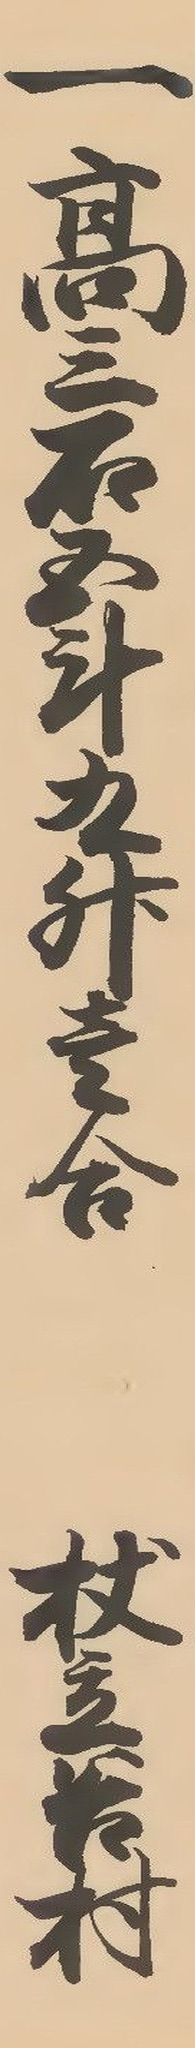一髙三石五斗九升壱合杖立谷村
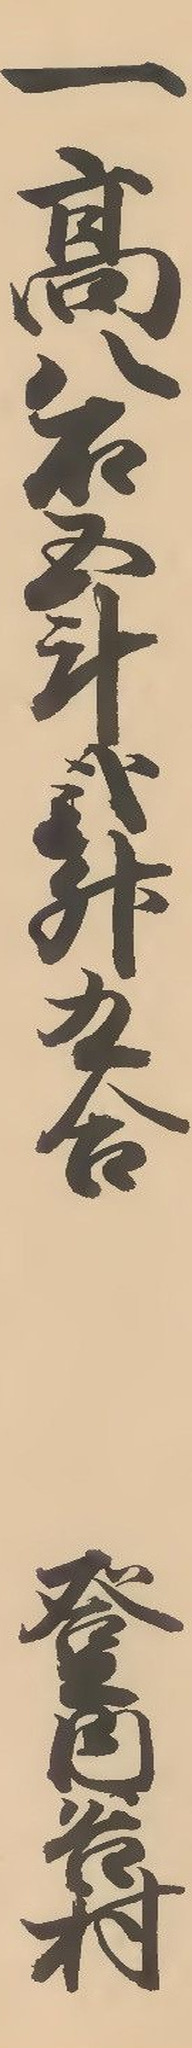一髙八石五斗弐升九合登内谷村
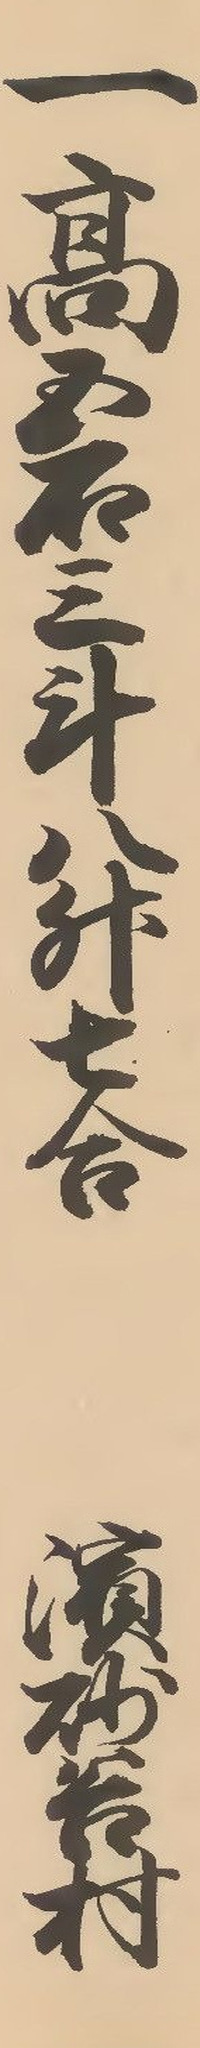一髙五石三斗八升七合濱砂谷村
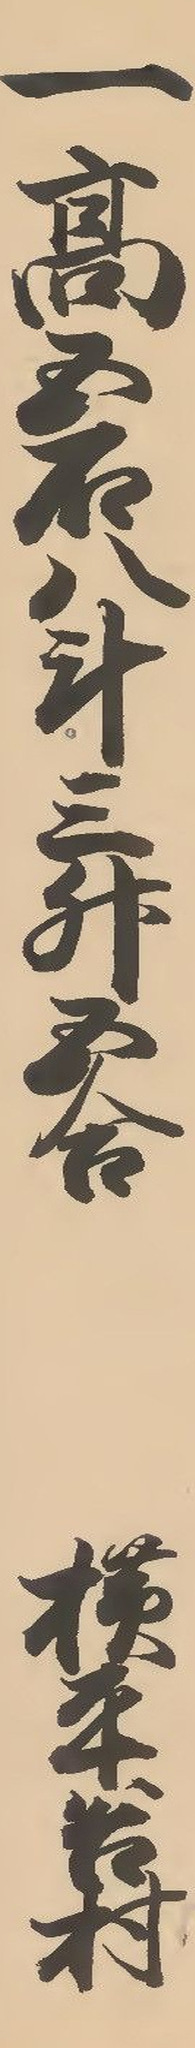一髙五石八斗三升五合横平谷村
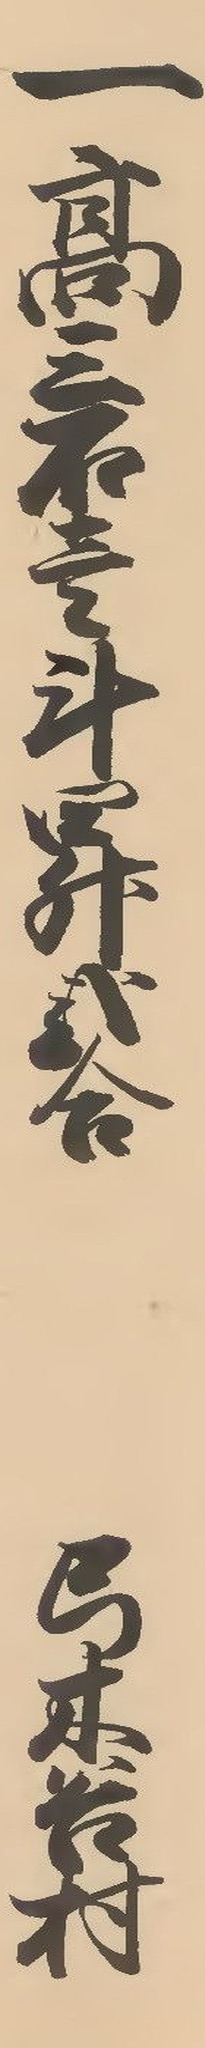一髙三石壱斗四升弐合弓木谷村
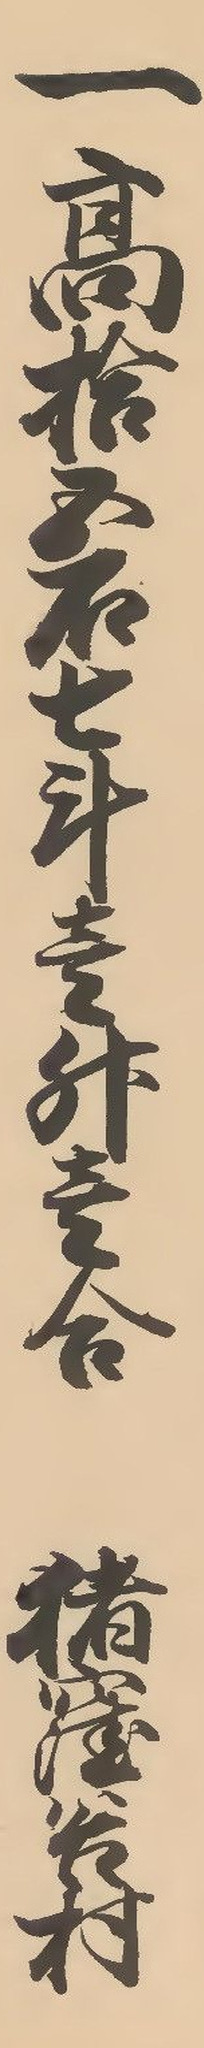一髙拾五石七斗壱升壱合猪窪谷村
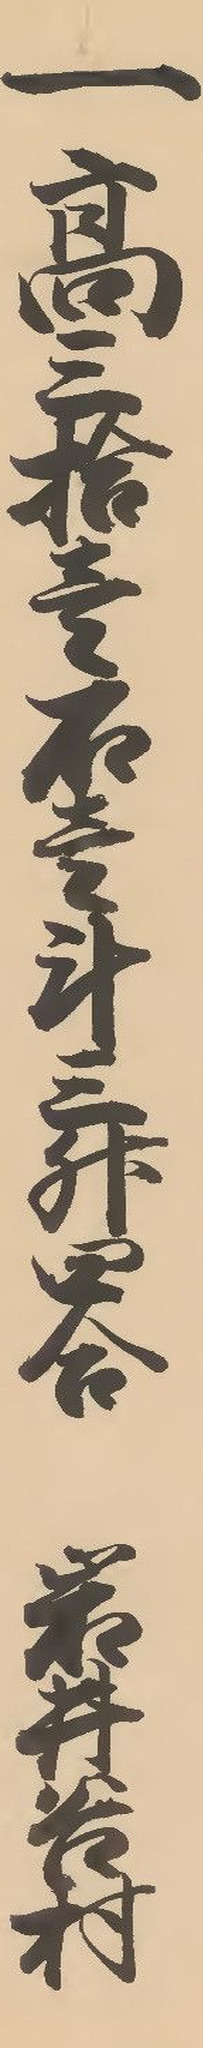一髙三拾壱石壱斗三升四合岩井谷村

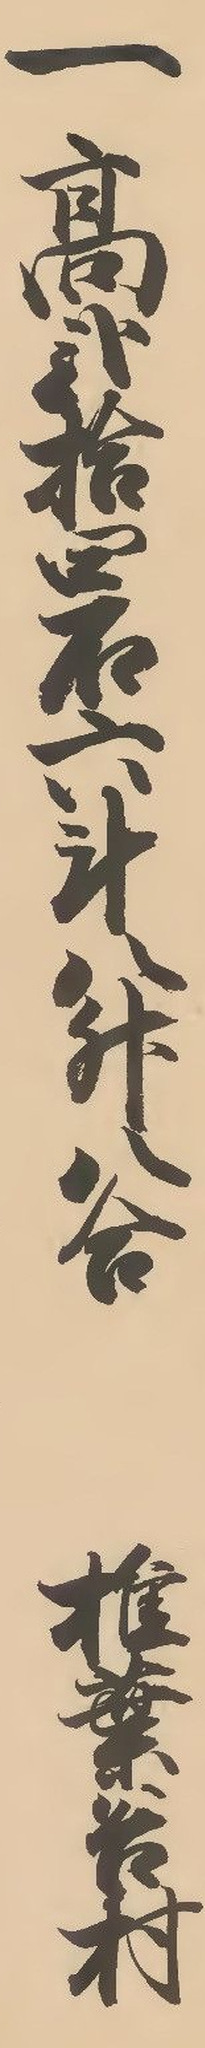一髙弐拾四石六斗八升八合椎葉谷村
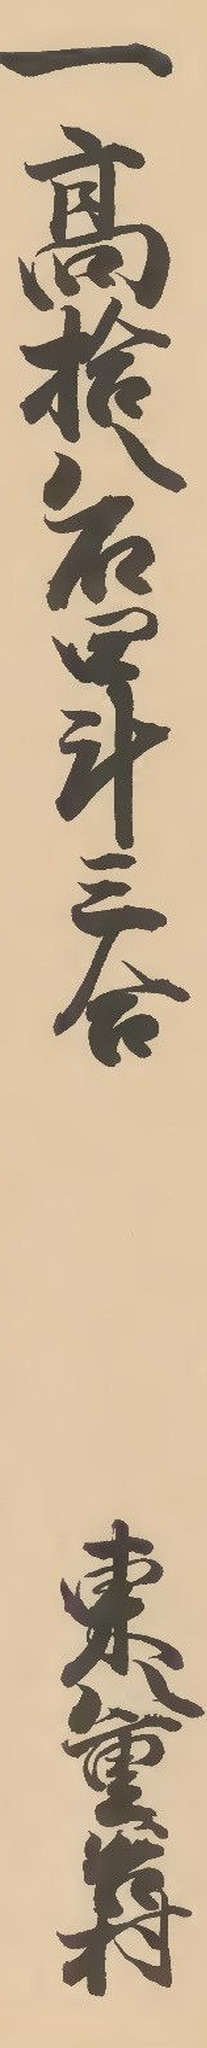一髙拾八石四斗三合東八重谷村
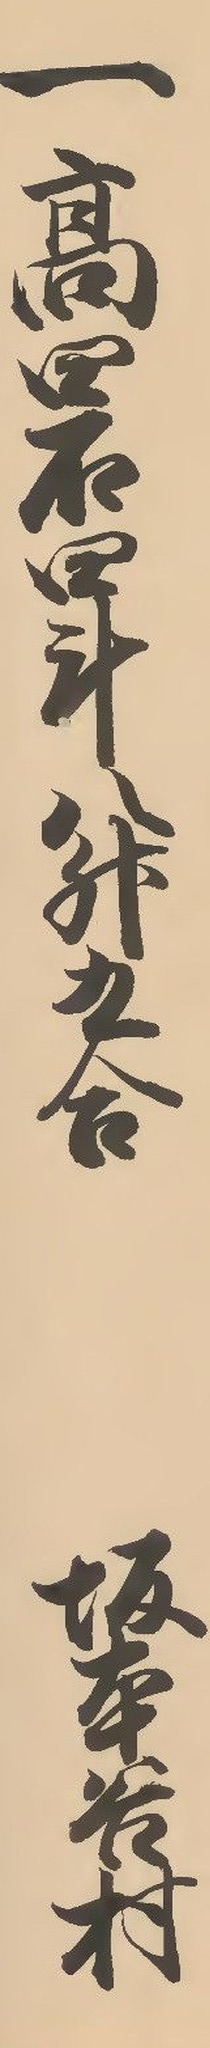一髙四石四斗八升九合坂本谷村
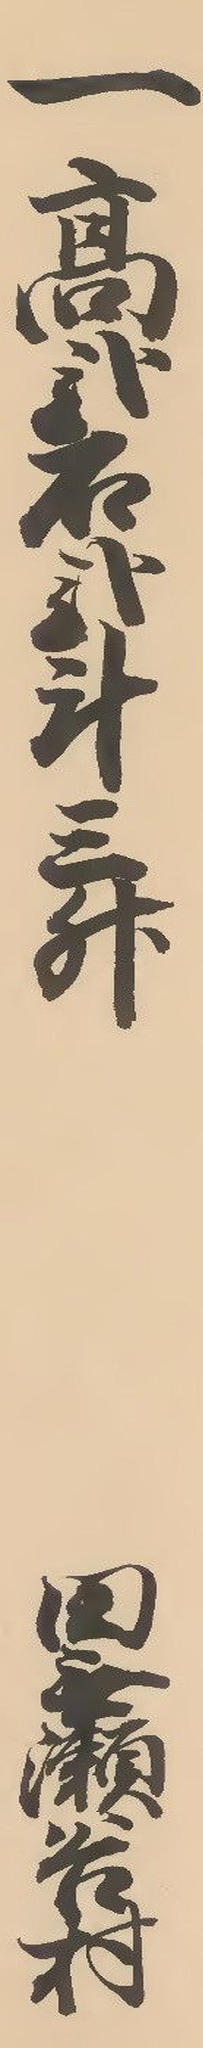一髙弐石弐斗三升田無瀬谷村
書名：肥後国郷帳
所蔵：国立公文書館 National Archives of Japan
